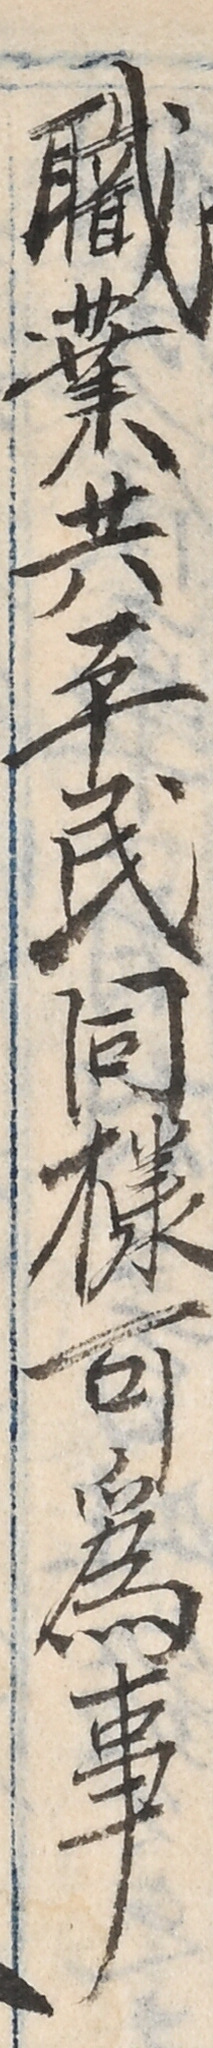職業共平民同様可為事
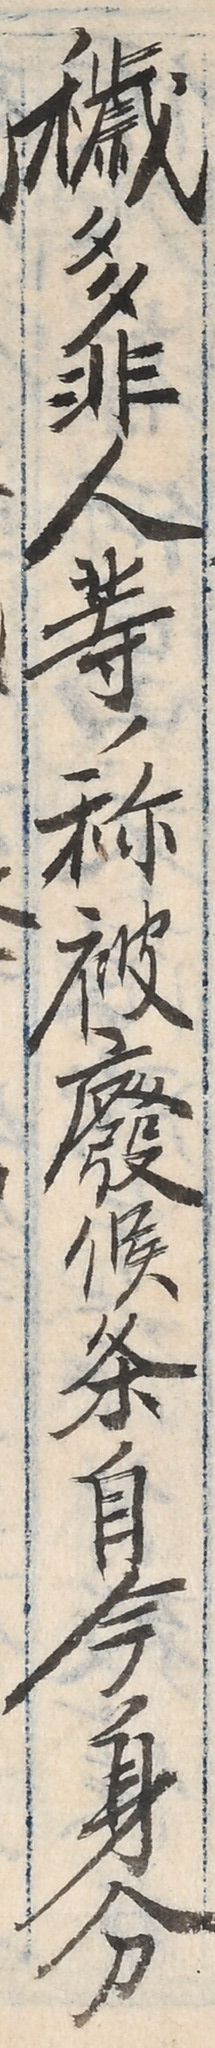穢多非人等ノ称被廃候条自今身分
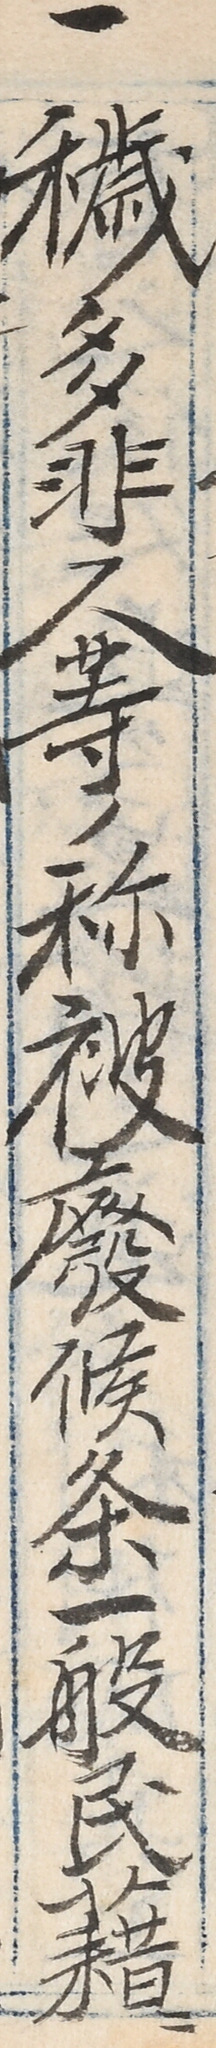一穢多非人等之称被廃候条一般民籍ニ
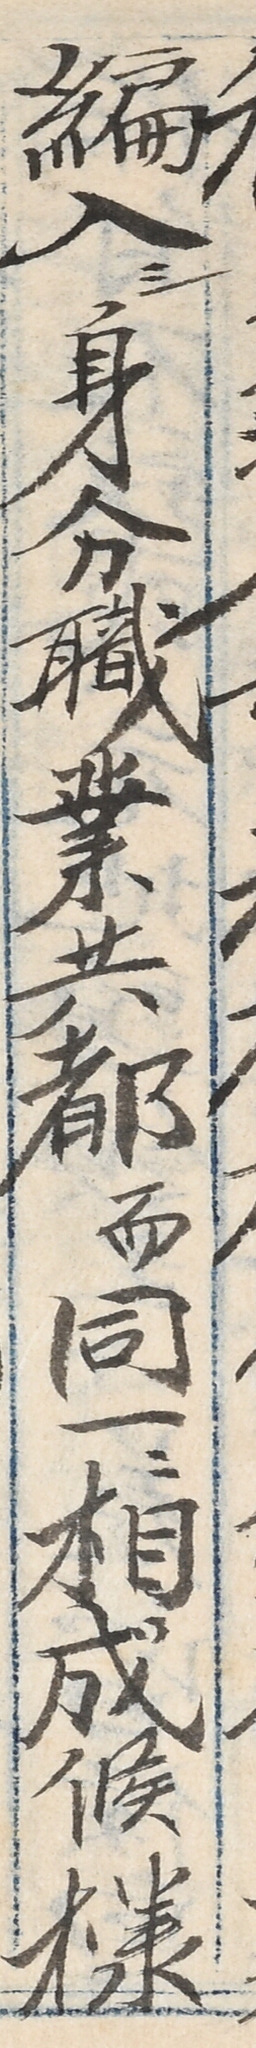編入シ身分職業共都而同一ニ相成候様
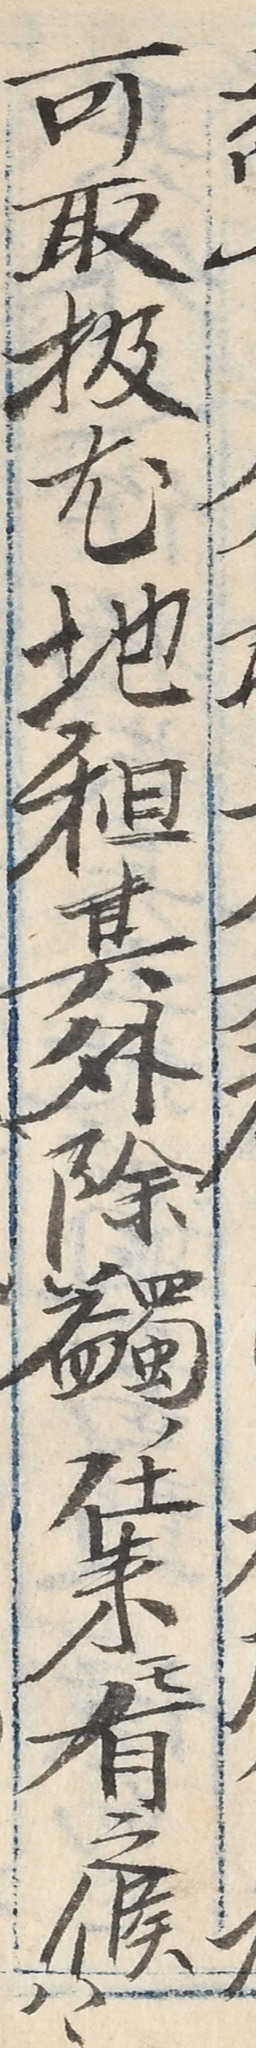可取扱尤地租其外除蠲ノ仕来モ有之候ハゝ
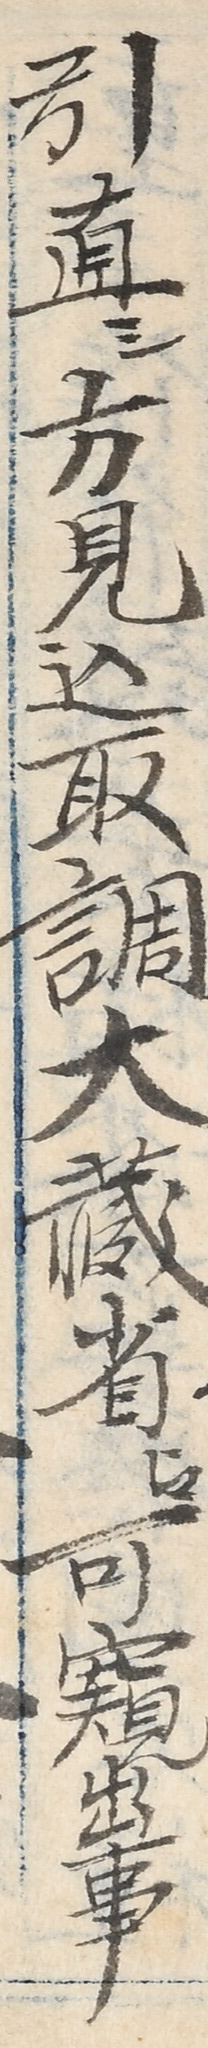引直シ方見込取調大蔵省江可窺出事
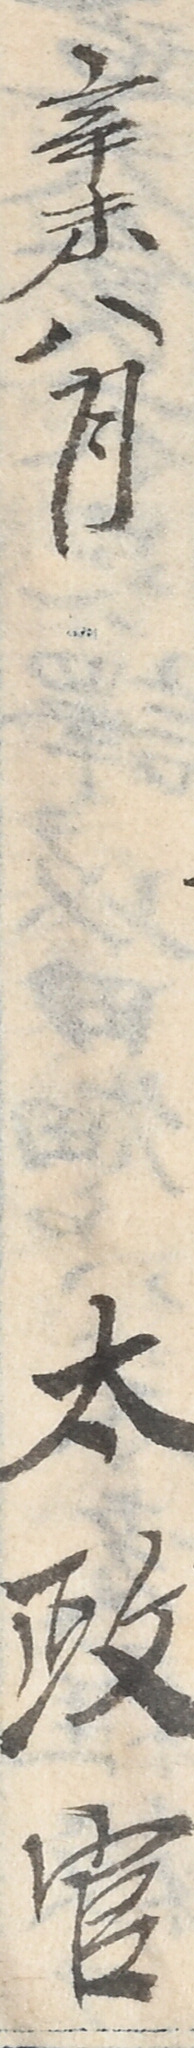辛未八月太政官

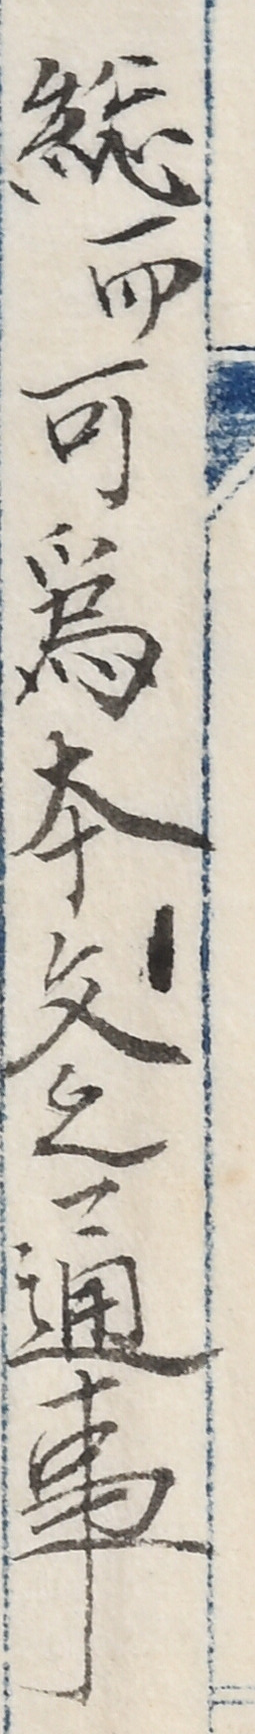総而可為本文之通事
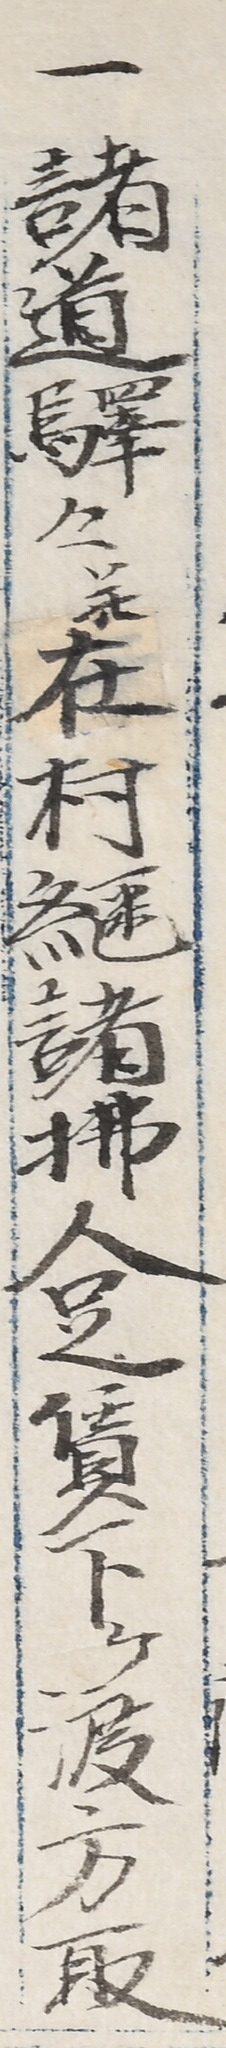一諸道駅々幷在村継諸払人足賃下ケ渡方取
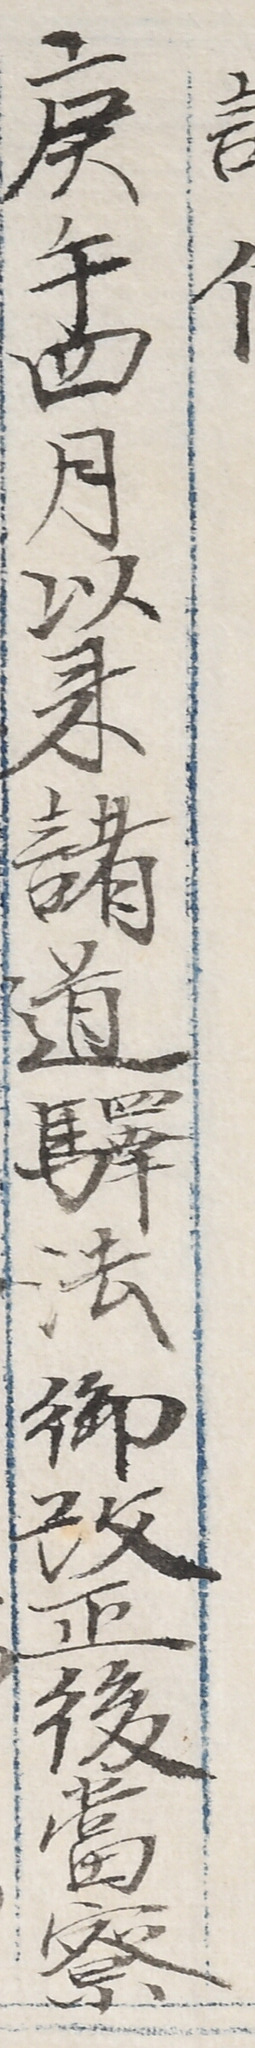庚午四月以来諸道駅法御改正後当寮
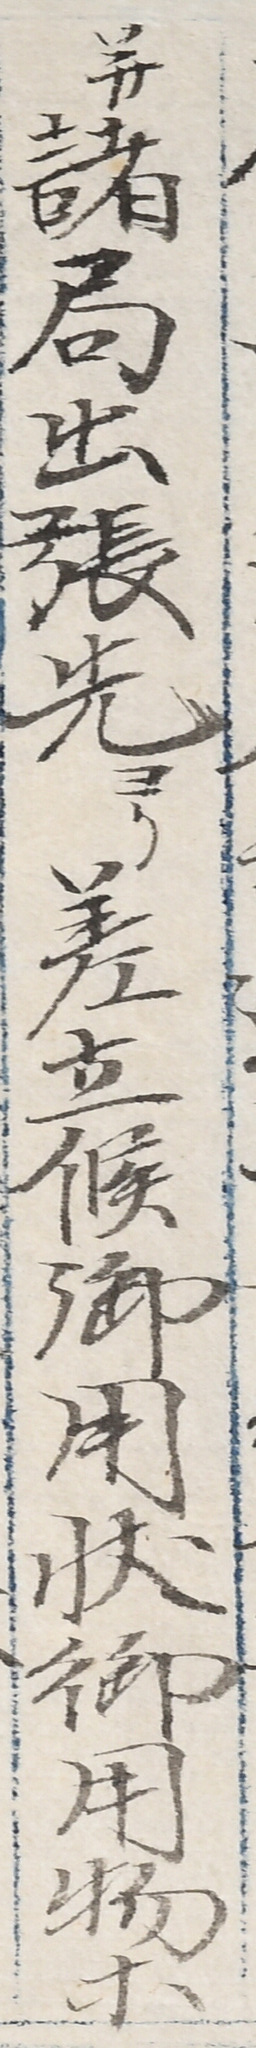幷諸局出張先ヨリ差立候御用状御用物等
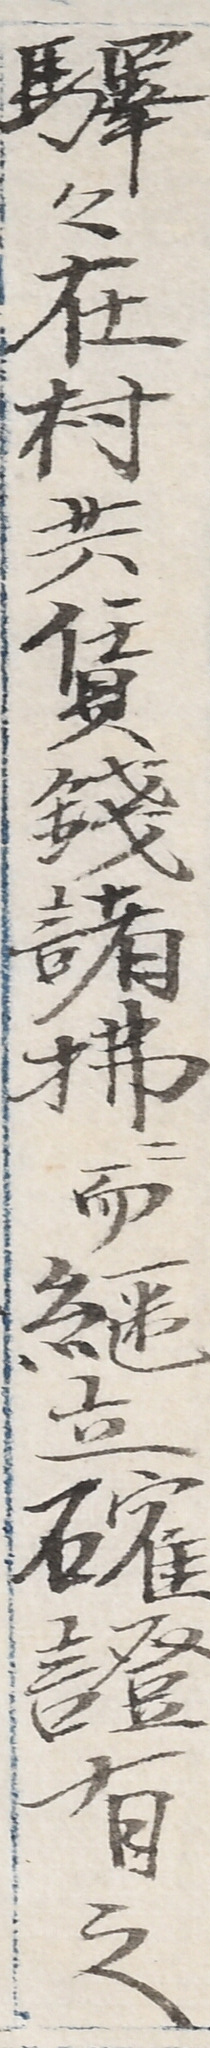駅々在村共賃銭諸払ニ而継立確証有之
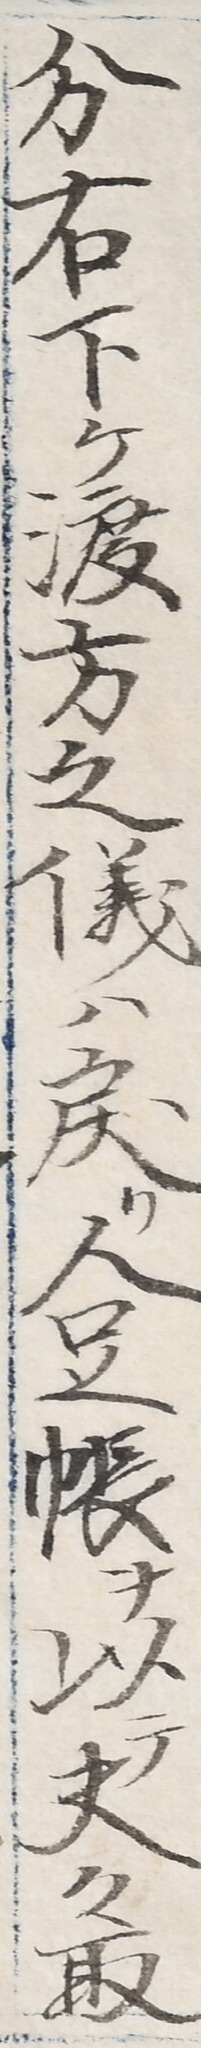分右下ケ渡方之儀ハ戻リ人足帳ヲ以テ夫々取
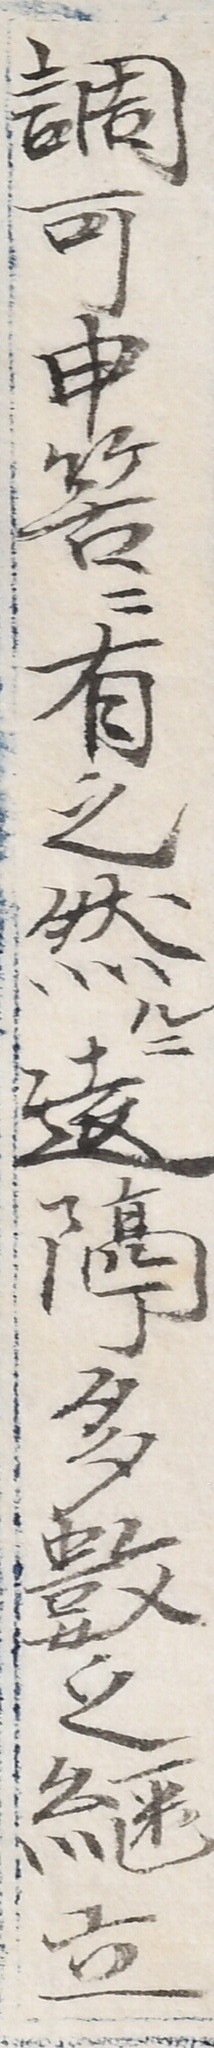調可申筈ニ有之然ルニ遠隔多数之継立
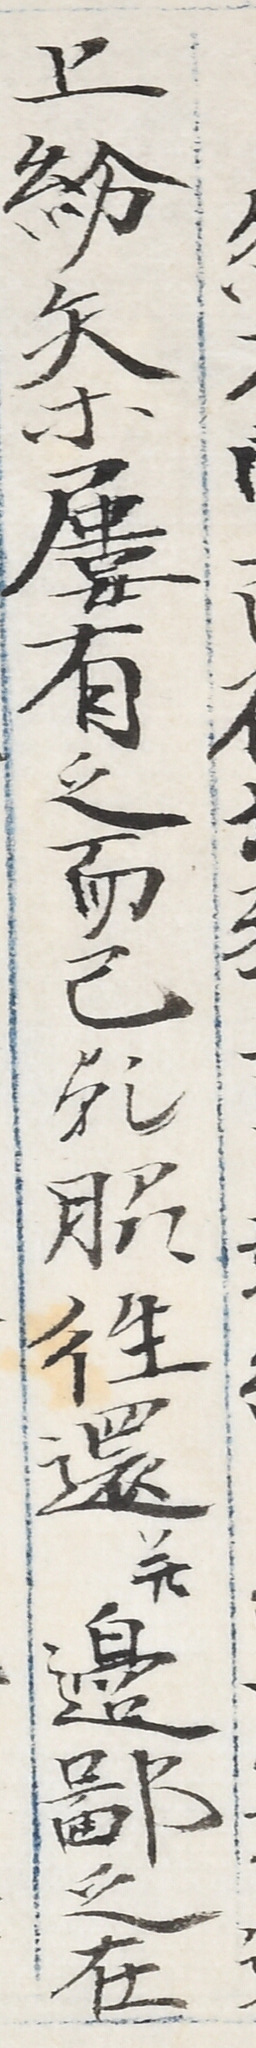上紛失等屢有之而己歟脇往還幷辺鄙之在
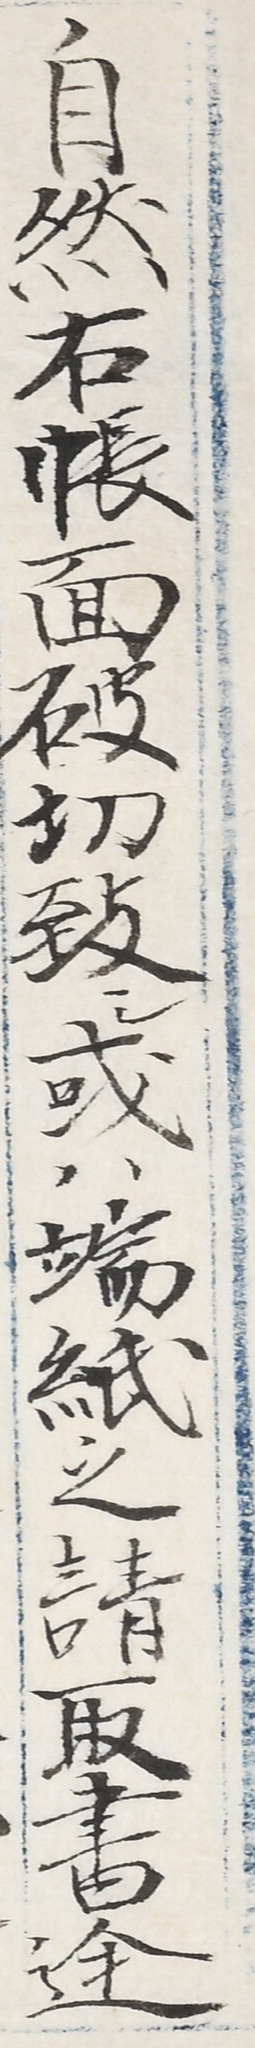自然右帳面破切致シ或ハ端紙之請取書途
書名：（通達）
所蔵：伊那市立高遠町図書館・合同会社AMANE
